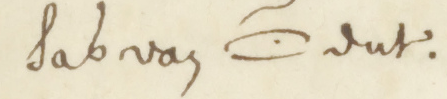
sas van Gent.
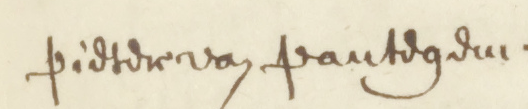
Pieter van Pantegem.
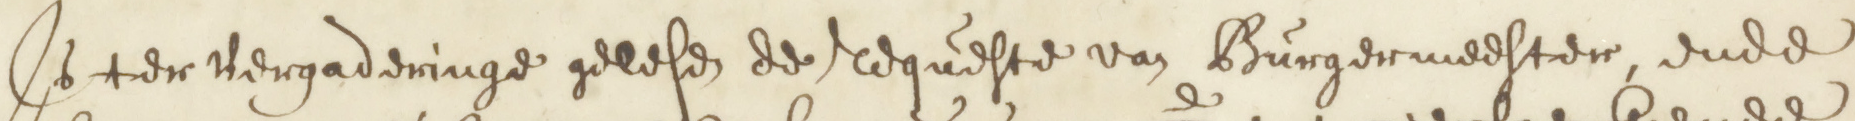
Is ter Vergaderinge gelesen de Requeste van Burgermeester, ende
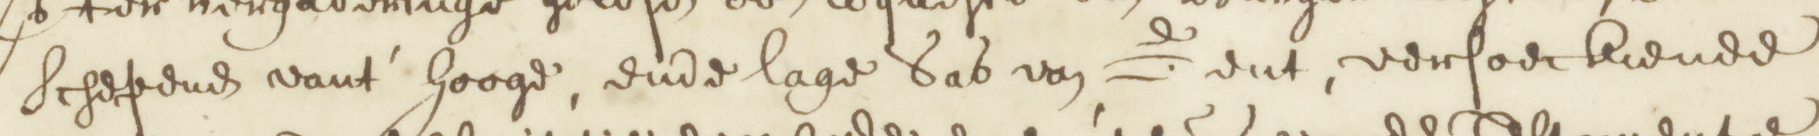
schepenen vant hooge, ende lage Sas van Gent, versoeckende
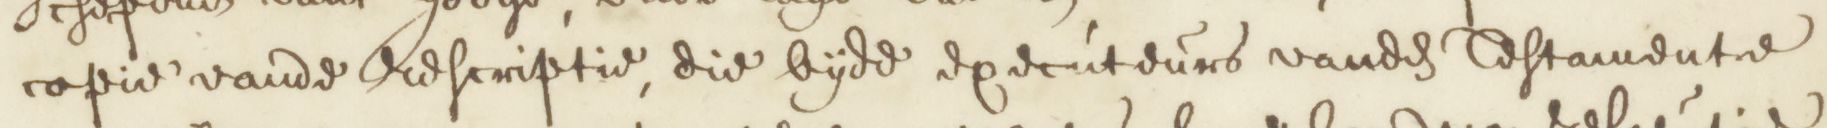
copie vande rescriptie, die bijde executeurs vanden Testamente
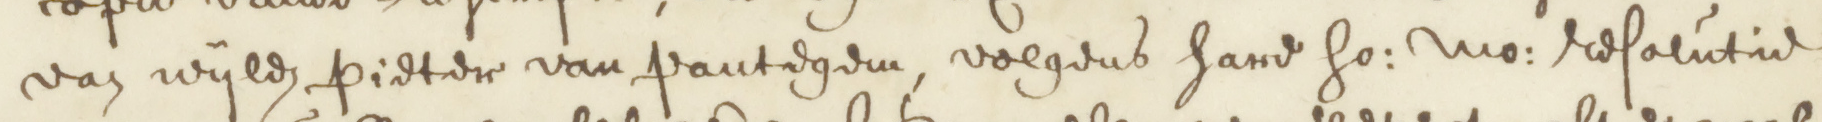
van wijlen Pieter van Pantegem, volgens hare ho:mo: resolutie
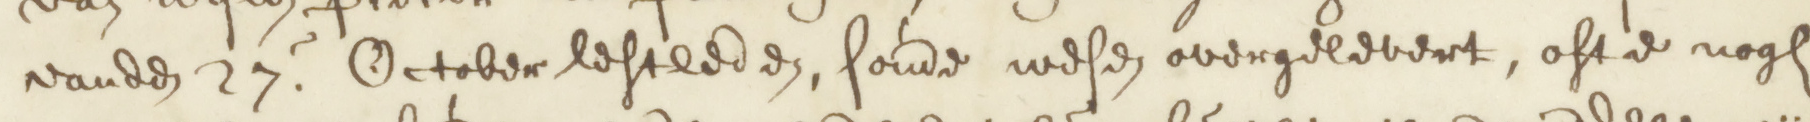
vanden 27e. October lestleden, soude wesen overgelevert, ofte nogh
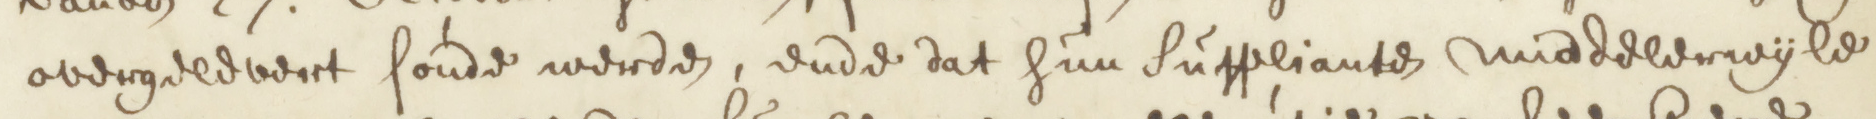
overgelevert soude werden, ende dat hun supplianten middelerwijle
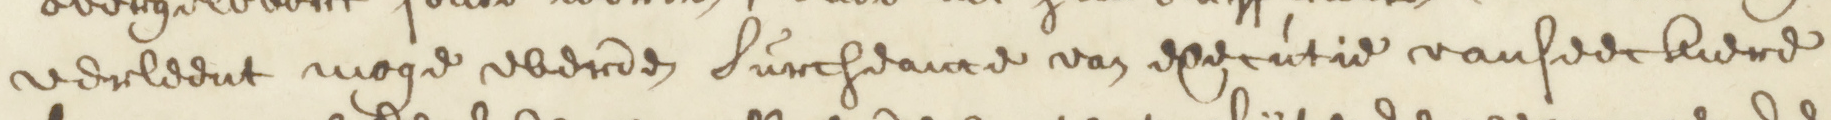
verleent moge werden surcheance van executie van seeckere
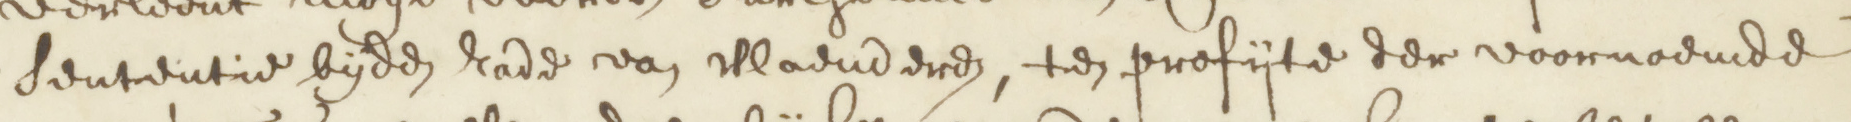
sententie bijden Rade van Vlaenderen, ten profijte der voornoemde
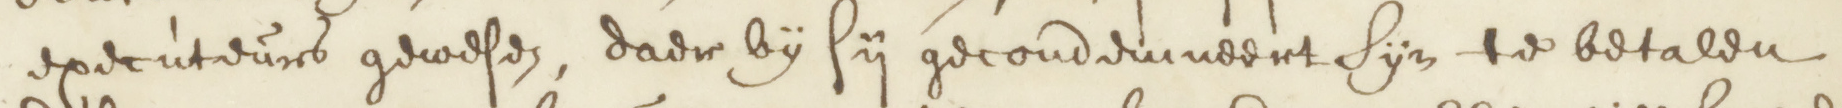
executeurs gewesen, daer bij sij gecondemneert sijn te betalen
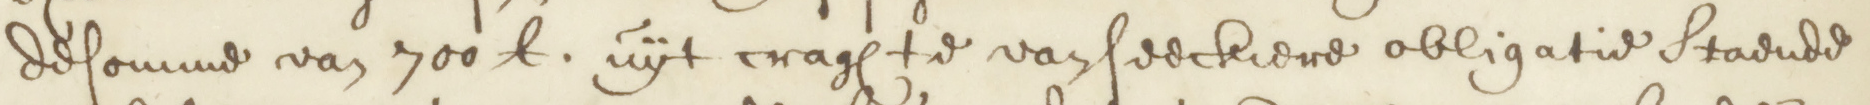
de somme van 700 l. uijt craghte van seeckere obligatie staende
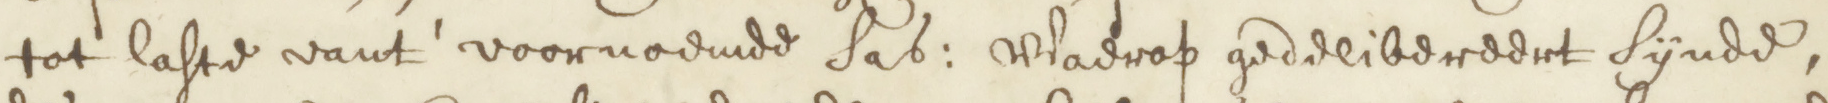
tot laste vant‛ voornoemde sas: Waerop gedelibereert sijnde,
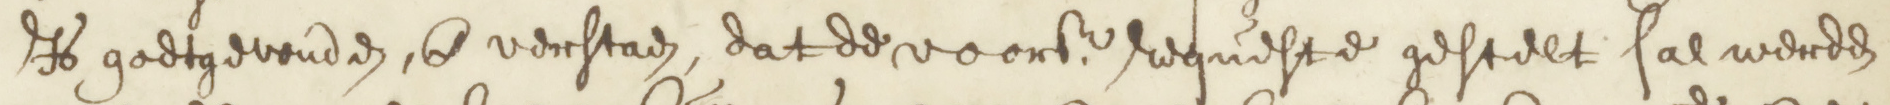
Is goetgevonden, & verstaen, dat de voors. Requeste gestelt sal werden
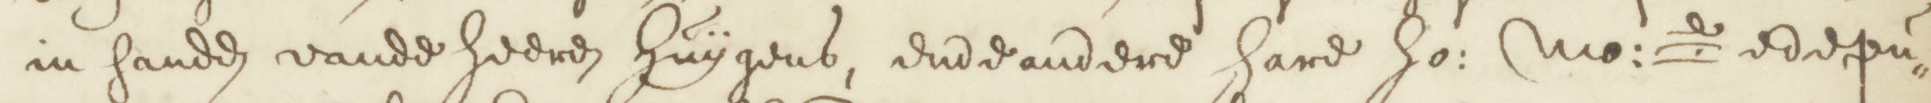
in handen vande heeren Huijgens, ende andere hare ho:Mo: Gedepu„
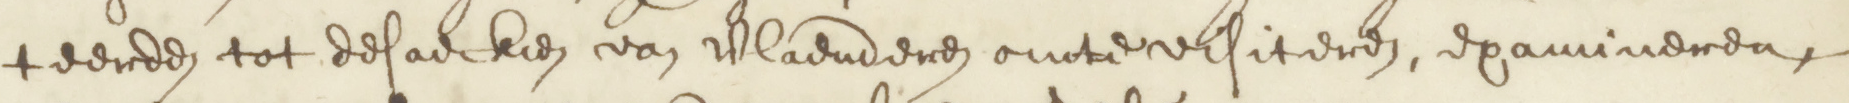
teerden tot de saecken van Vlaenderen om te visiteren, examineren,
